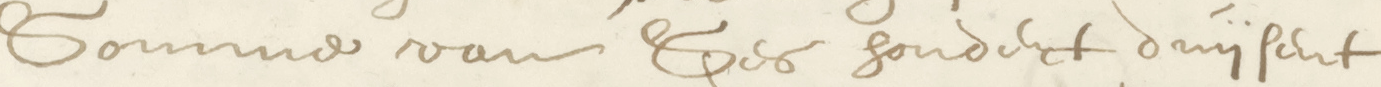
Somme van Ses hondert duijsent
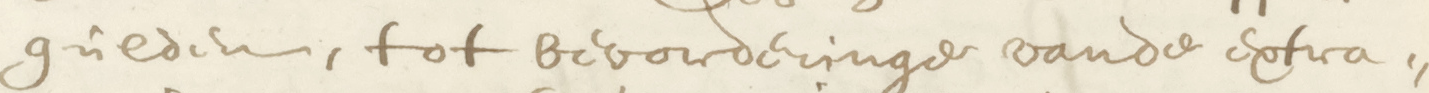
gulden, tot bevorderinge vande extra„
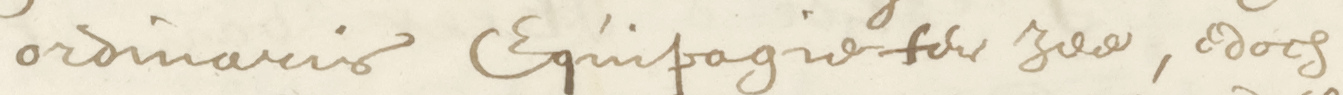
ordinaris Equipagie ter zee, edoch
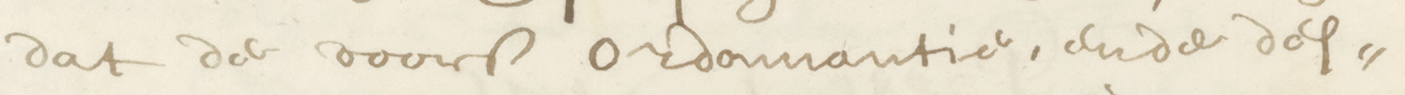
dat de voors Ordonnantie, ende des„
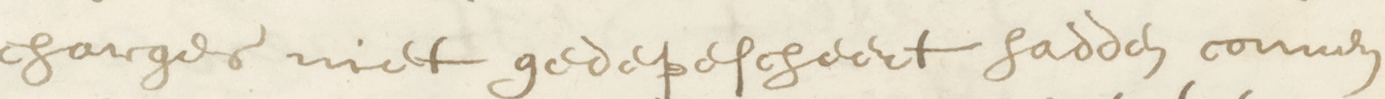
charges niet gedepescheert hadden connen
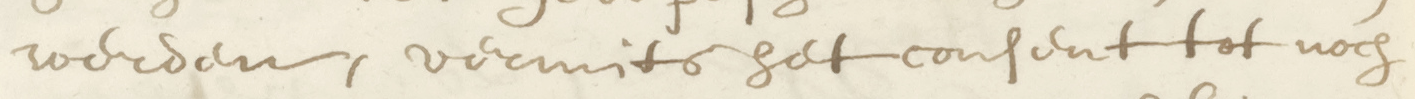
werden, vermits het consent tot noch
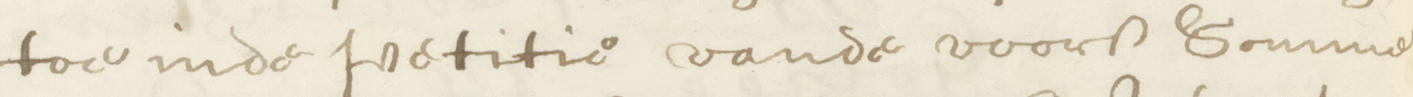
toe inde Petitie vande voors Somme
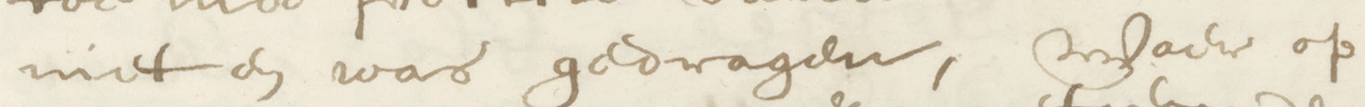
niet en was gedragen. Waer op
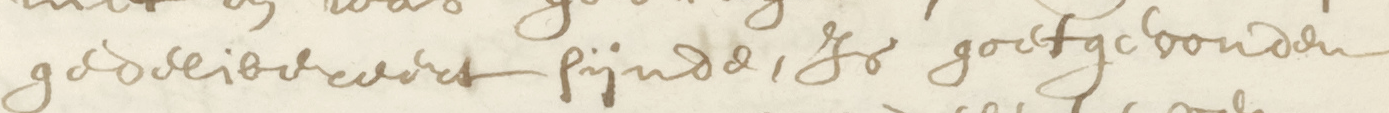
gedelibereert sijnde, Is goetgevonden
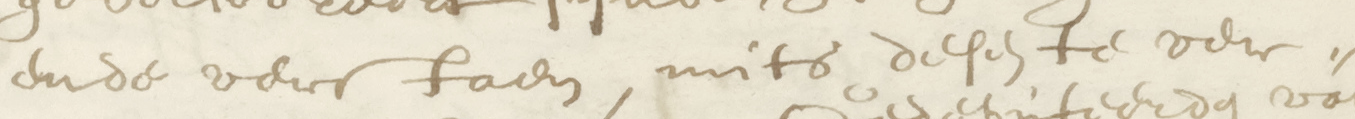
ende verstaen, mits desen te ver„
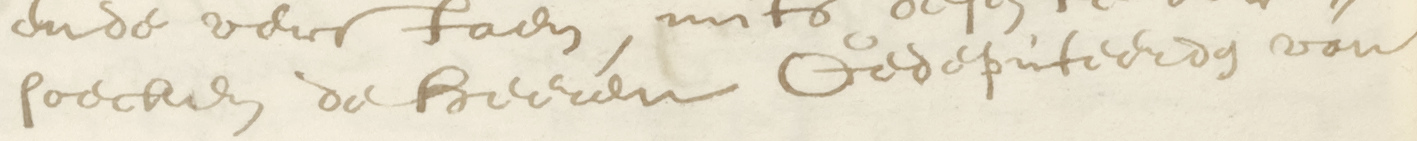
soecken de Heeren Gedeputeerden van
